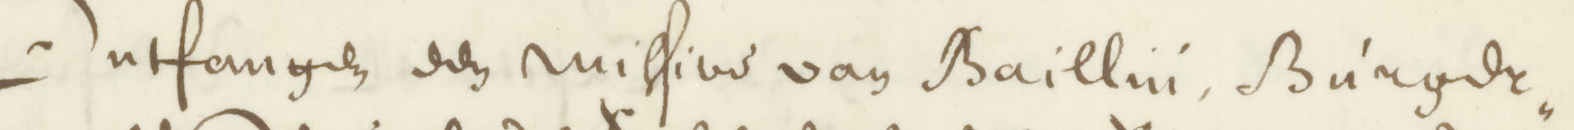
Ontfangen een missive van Baillu, Burger,,
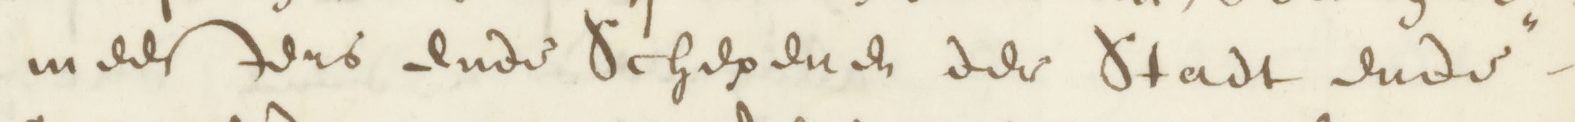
meesters ende Schepenen der Stadt ende
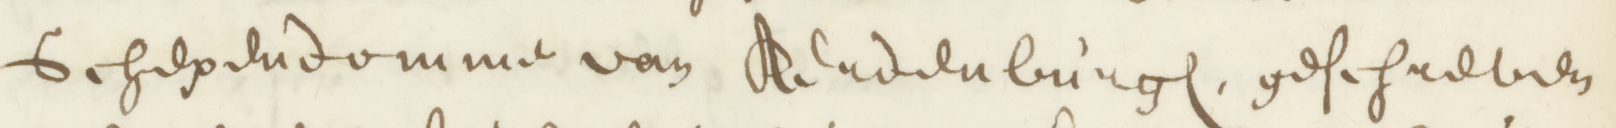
Schependomme van Aerdenburgh, geschreven
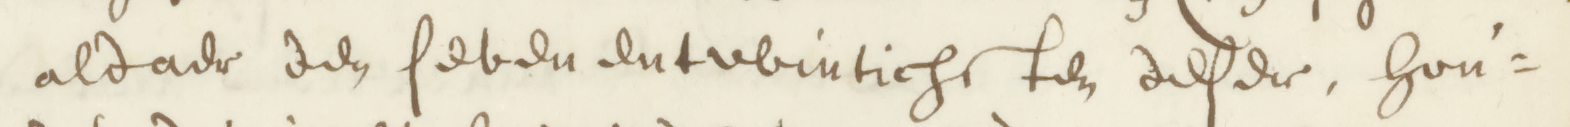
aldaer den sevenentwintichsten deser, hou=
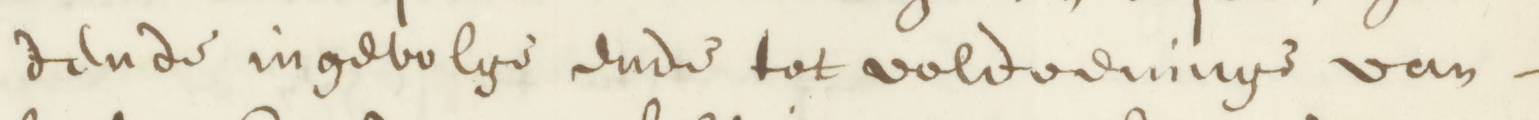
dende ingevolge ende tot voldoeninge van
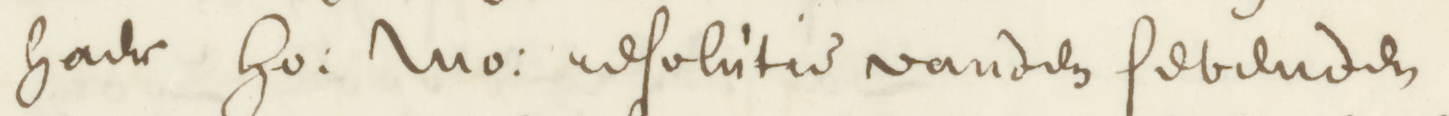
haer ho:mo: resolutie vanden sevenden
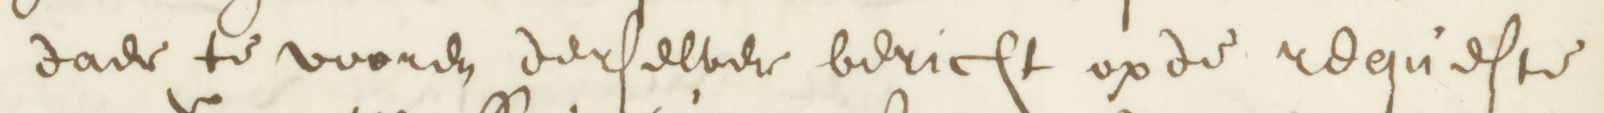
daer te vooren derselver bericht opde requeste
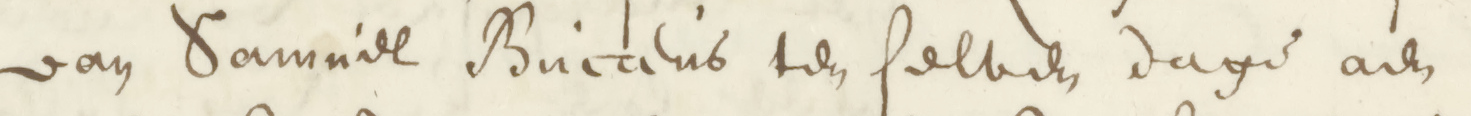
van Samuel Bucæus ten selven dage aen
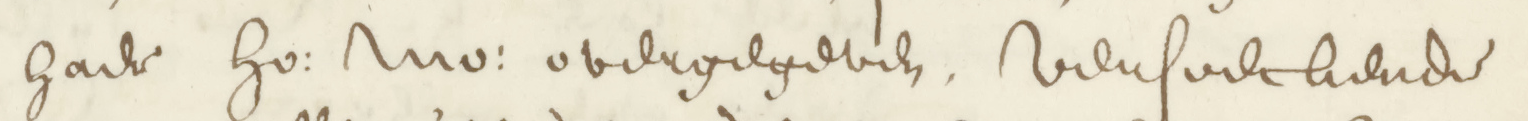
haer ho:mo: overgegeven, versoeckende
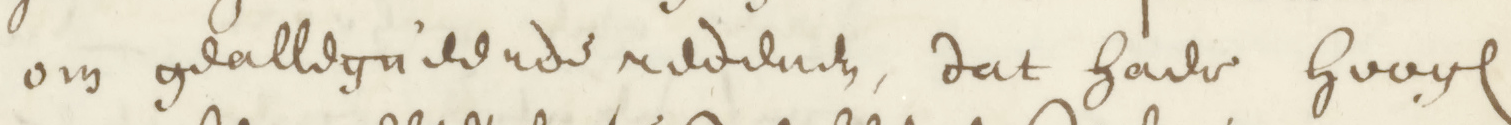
om geallegueerde redenen, dat haer hoogh
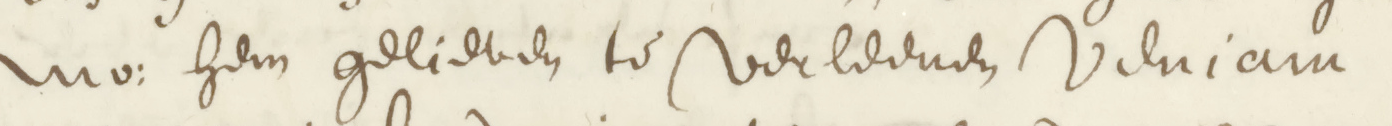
mo: hem gelieven te verleenen Veniam
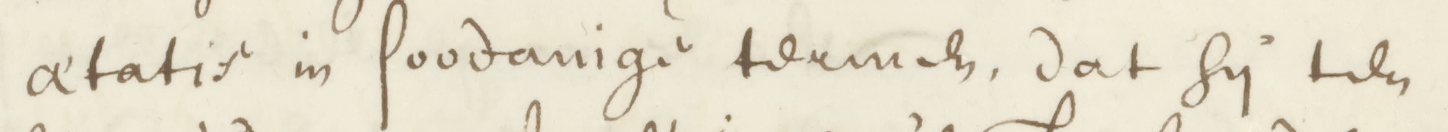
ætatis in soodanige termen, dat hij ten
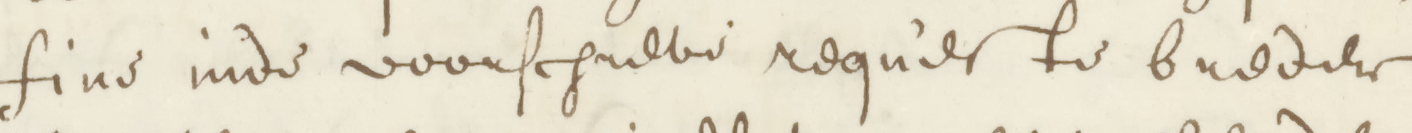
fine inde voorschreve requeste breder
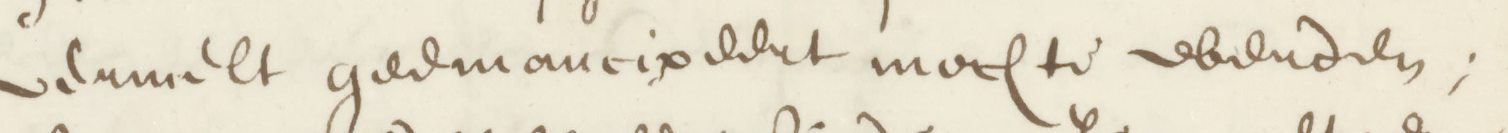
vermelt geemancipeert mochte werden;
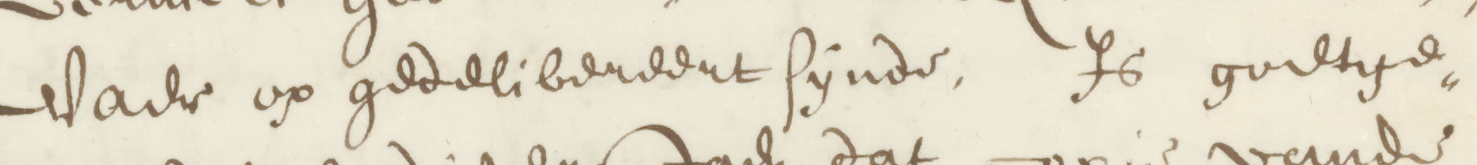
Waer op gedelibereert sijnde, Is goetge,,
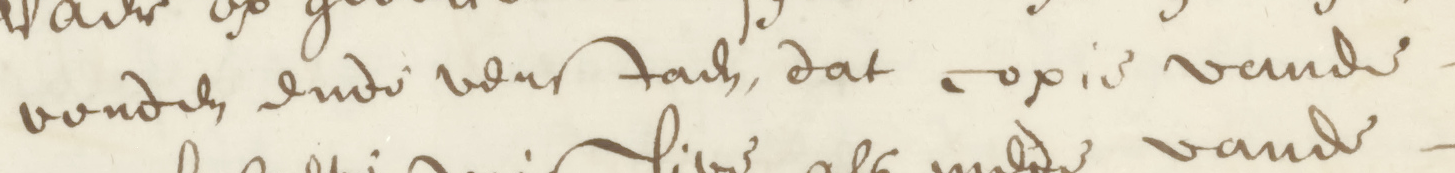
vonden ende verstaen, dat copie vande
